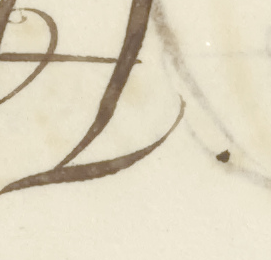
H.
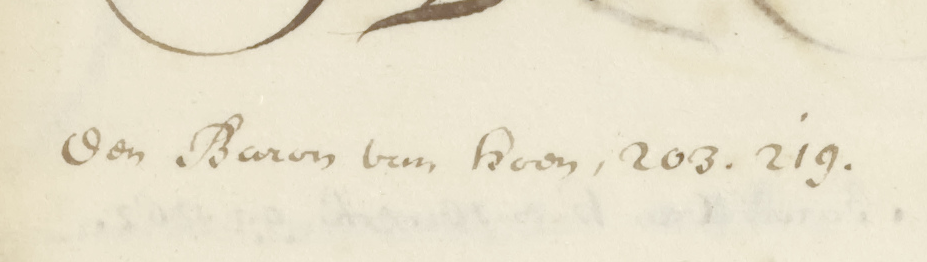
Den Baron van Hoen, 203, 219
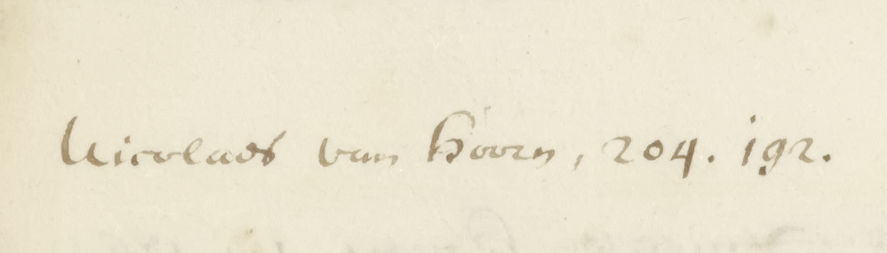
Nicolaes van Hoorn, 204, 192
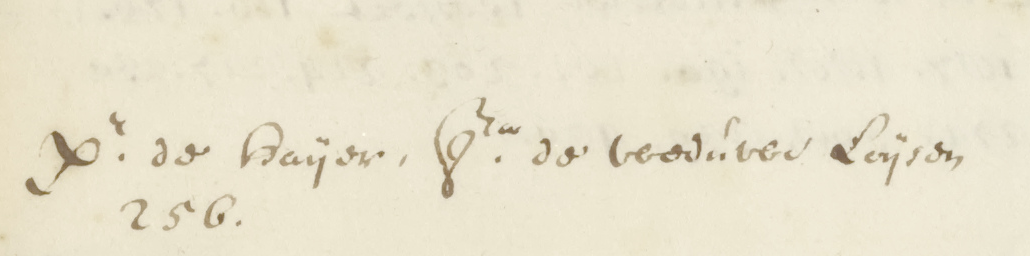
Pr. de Haijer, ϭa de weduwe Leijsen
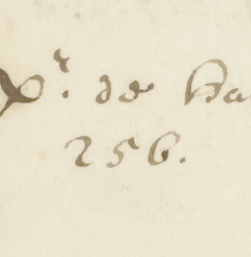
256.
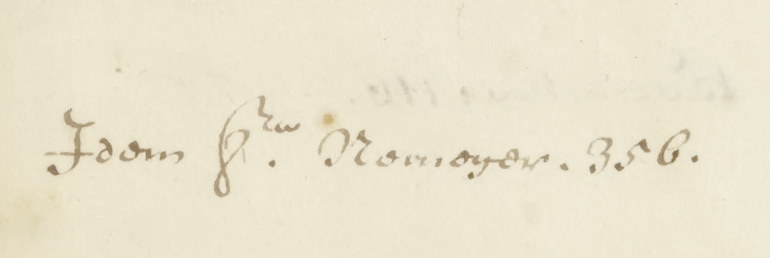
Idem ϭa Nemeijer, 356.
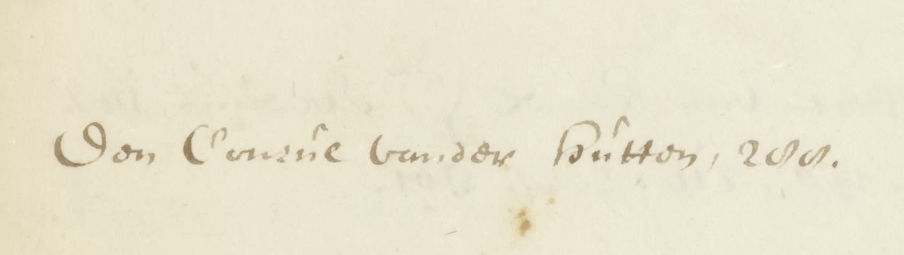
Den Consul vander Hutten, 288.
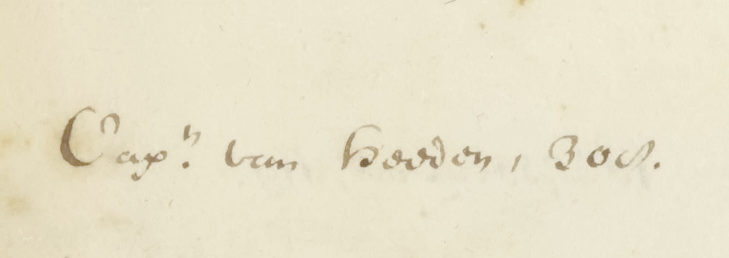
Capn. van Heeden, 308.
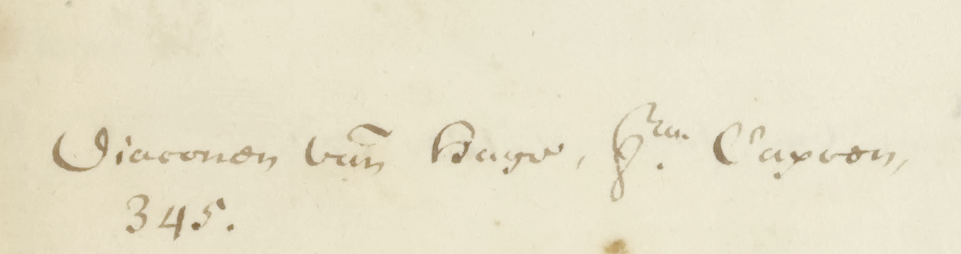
Diaconen van Hage ϭa Capoen,
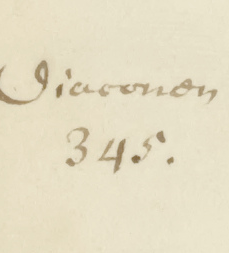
345.
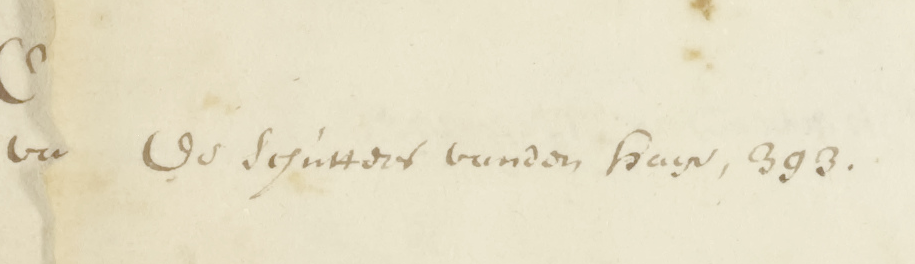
De schutters vanden Hage, 393.
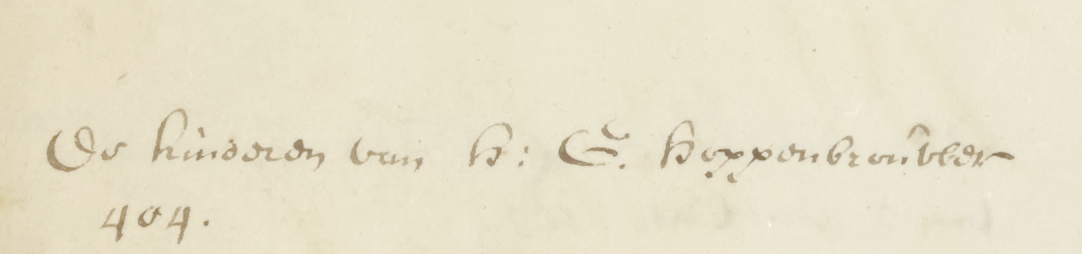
De kinderen van H: G. Hoppenbrouwer
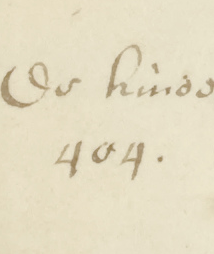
404.
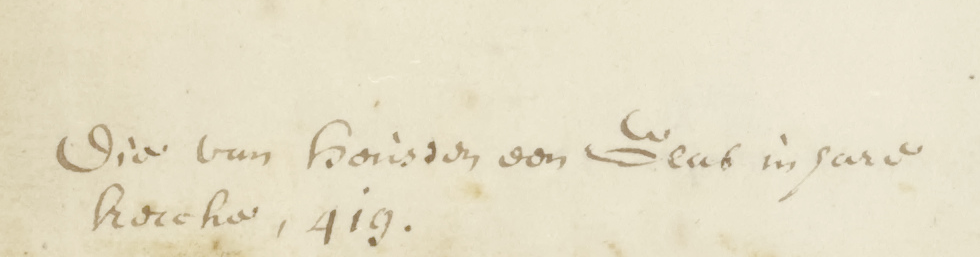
Die van Heusden een Glas in hare
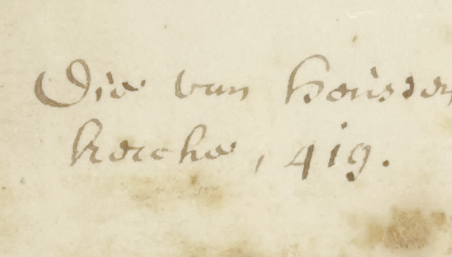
kercke, 419
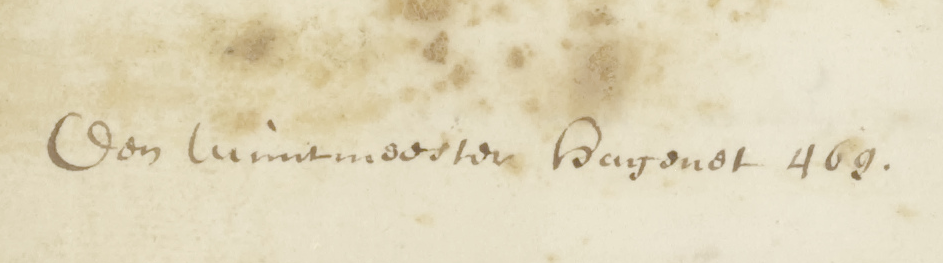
Den muntmeester Hagenet 469.
